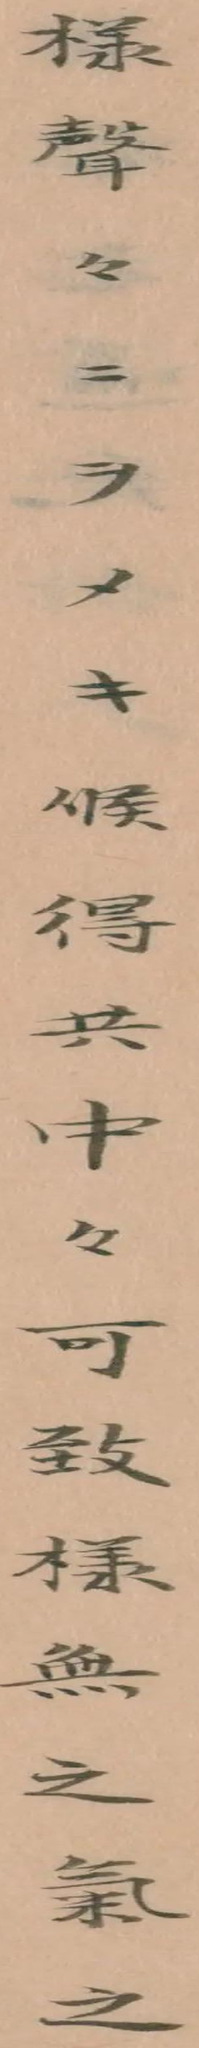様声々二ヲメキ候得共中々可致様無之気之
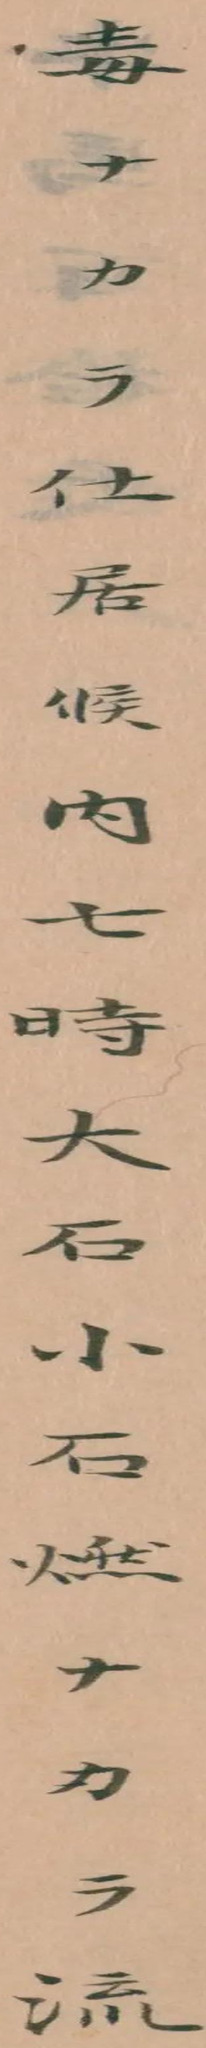毒ナカラ仕居候内七時大石小石燃ナカラ流
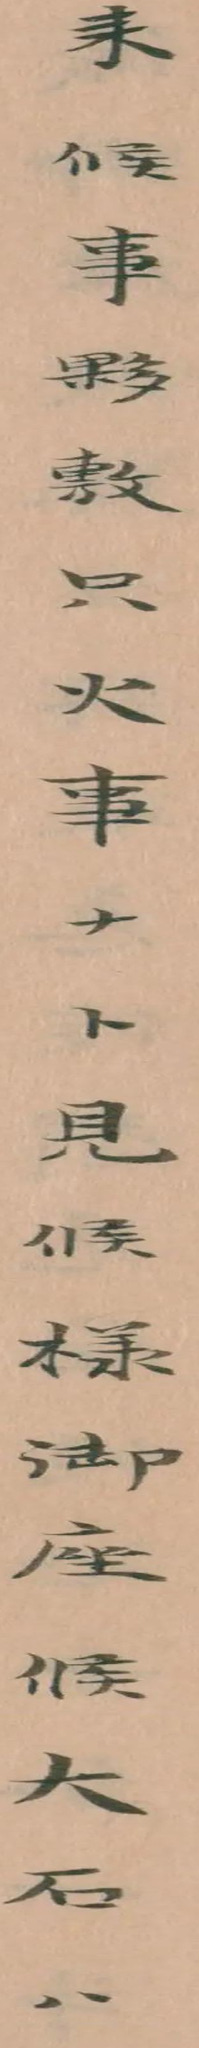来候事夥敷只火事ナト見候様御座候大石ハ
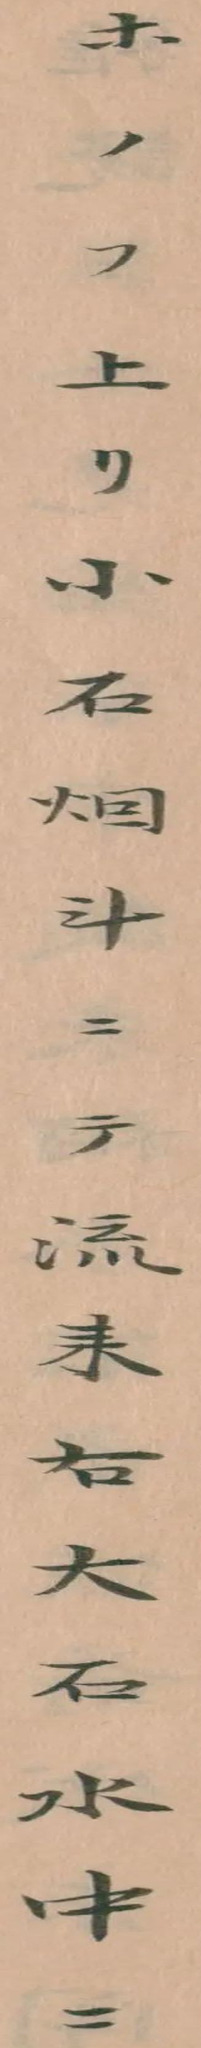ホノフ上り小石烟斗ニテ流来右大石水中二
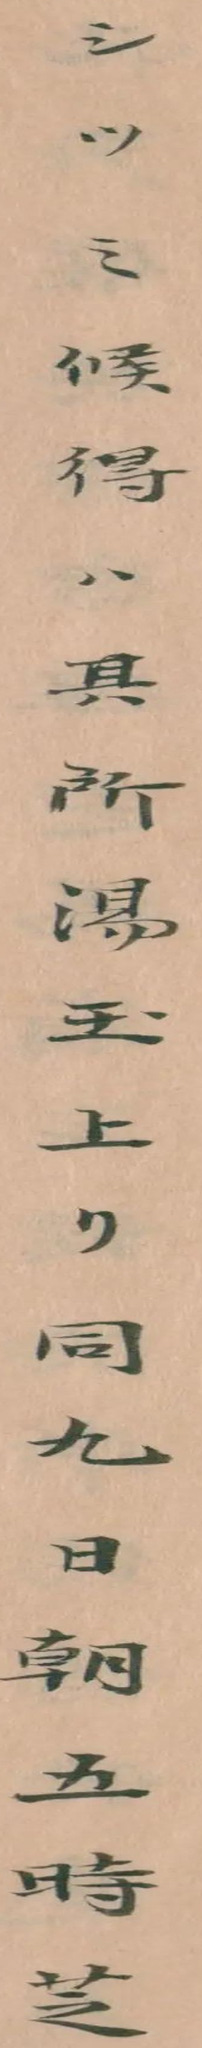シッミ候得ハ其所湯玉上り同九日朝五時芝
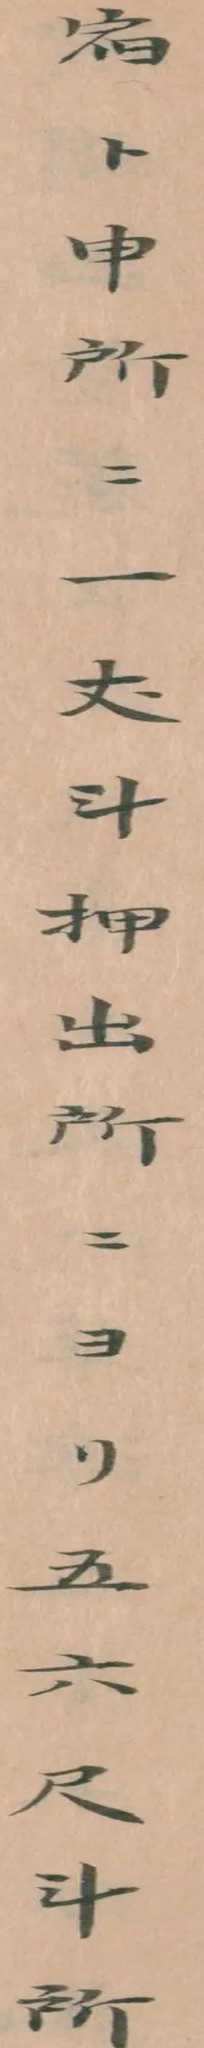宿ト申所二一丈斗押出所二ヨリ五六尺斗所
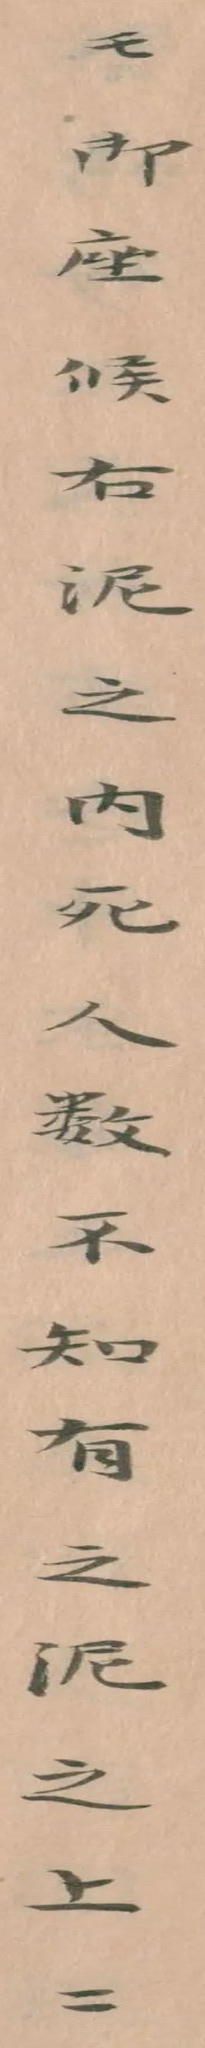モ御座候右泥之内死人数不知有之泥之上二
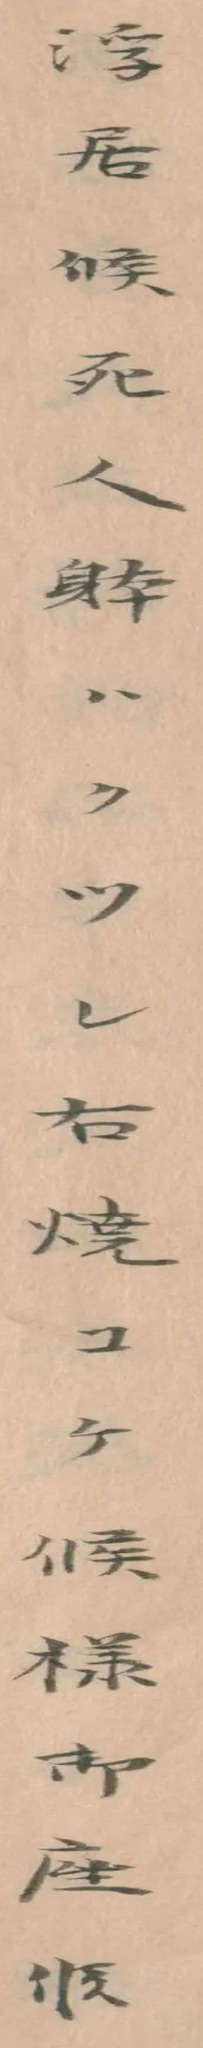浮居候死人体ハクツレ右焼コケ候様御座候
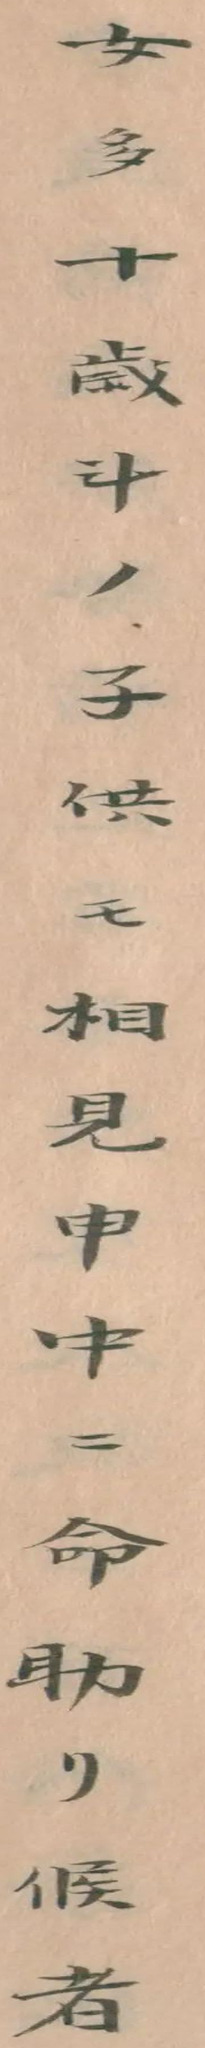女多十歳斗ノ子供モ相見申中二命助リ候者
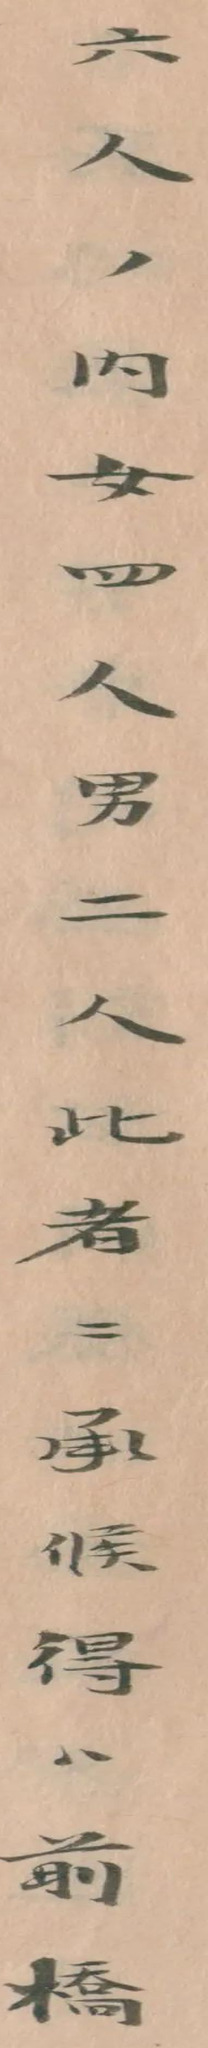六人ノ内女四人男二人此者二承候得ハ前橋
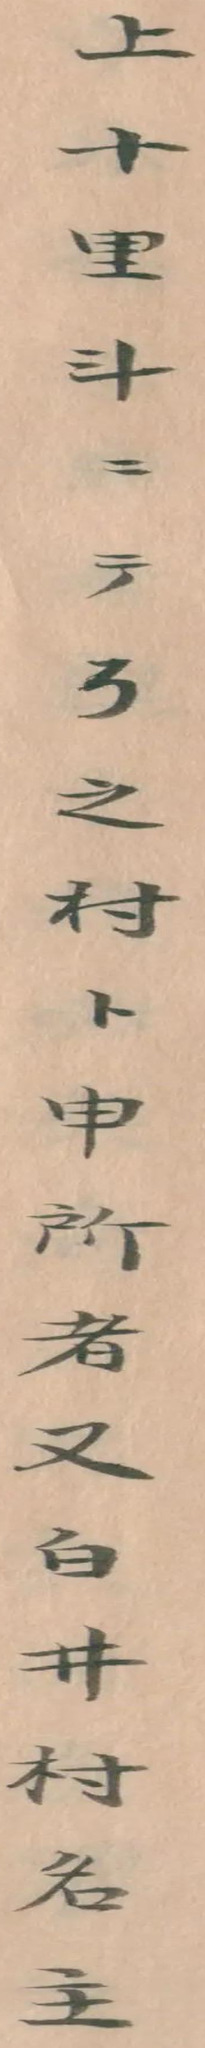上十里斗ニテ弓之村ト申所者又白井村名主
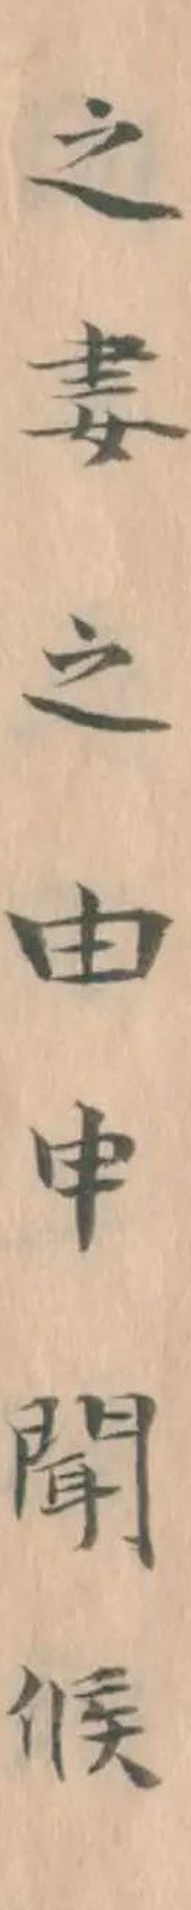之妻之由申聞候

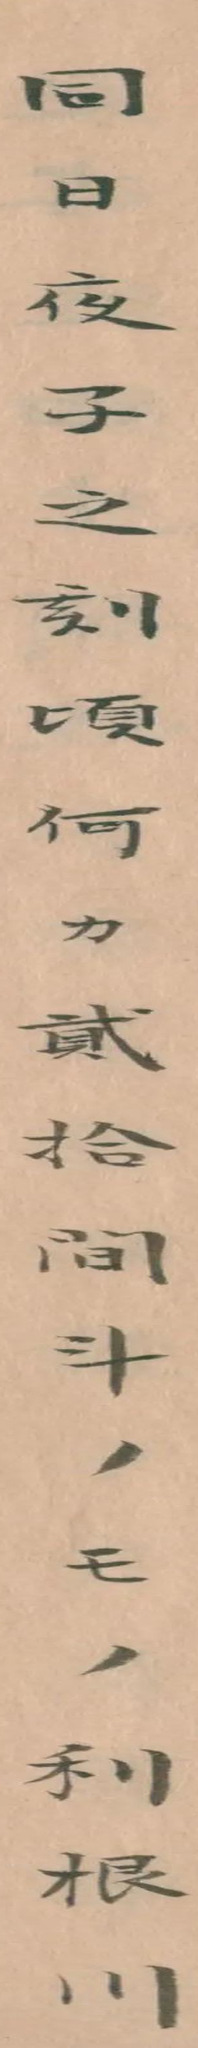一同日夜子之刻頃何カ弐拾間斗ノモノ利根川
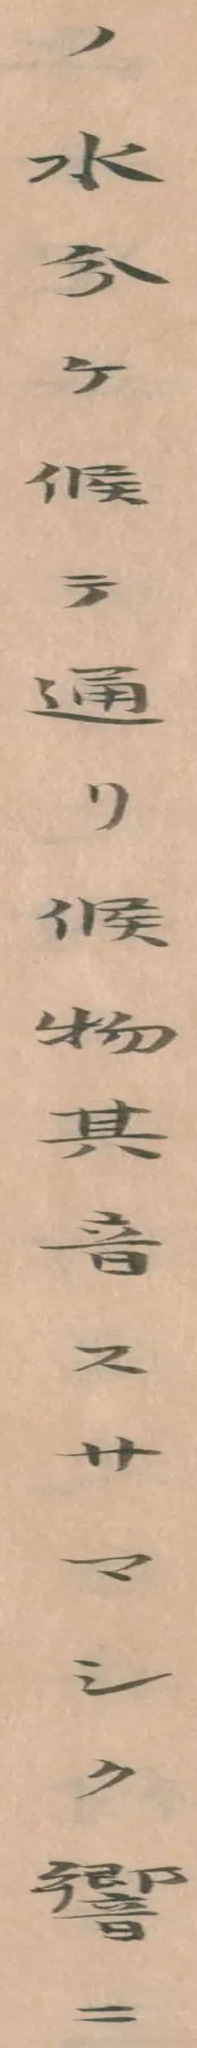ノ水分ヶ候テ通リ候物其音スサマシク響二
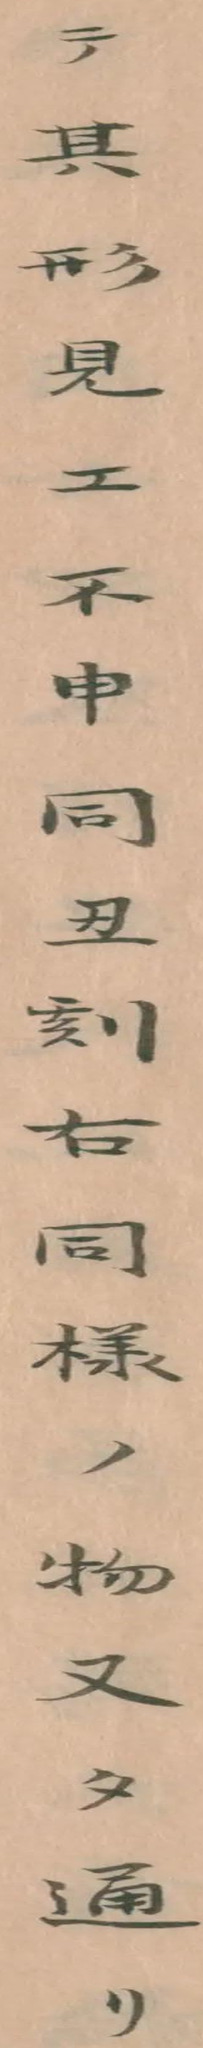テ其形見エ不申同丑刻右同様ノ物又タ通リ
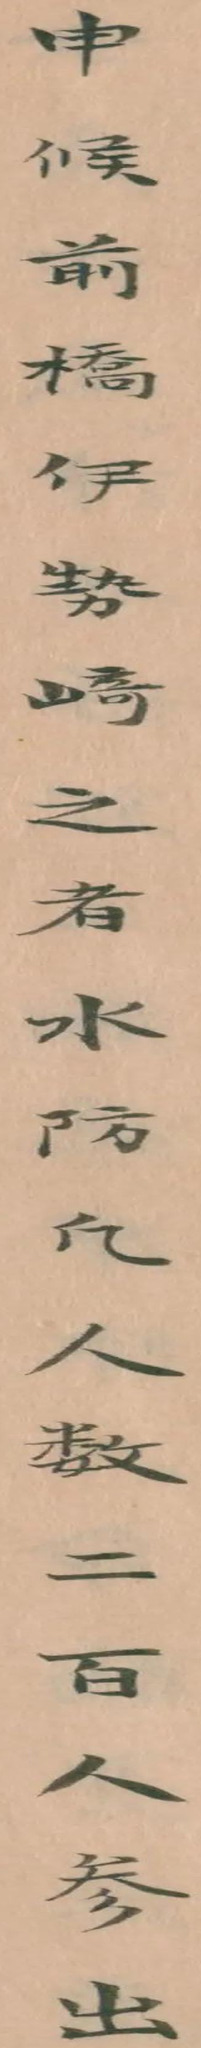申候前橋伊勢崎之者水防凡人数二百人参出
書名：地災撮要. 巻1(噴火山・地震ノ部)
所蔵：国立国会図書館 National Diet Library, JAPAN
